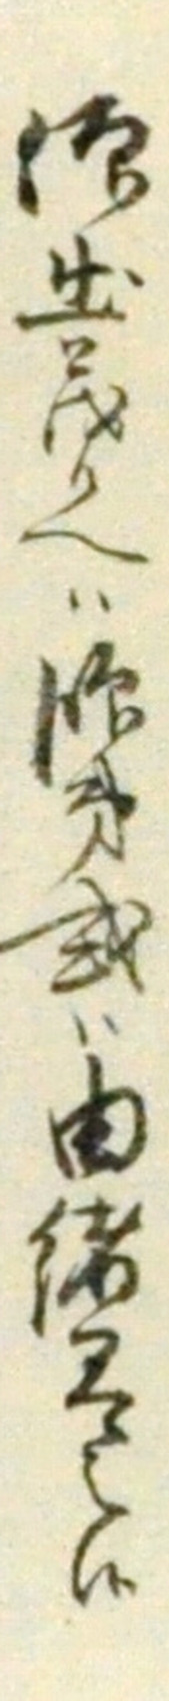仰出も候へは師弟或は由緒有之候
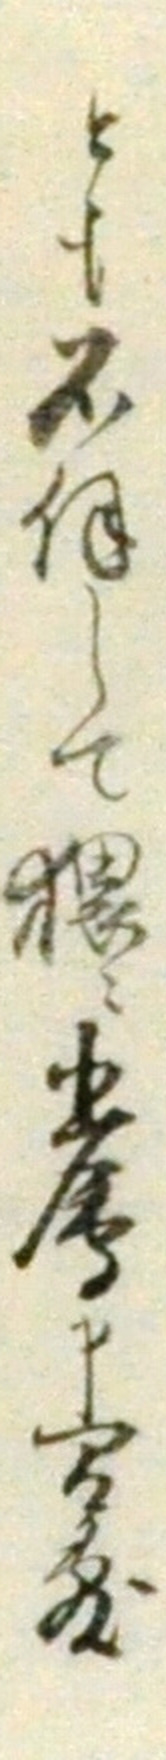とも不伺して猥に出会申間敷
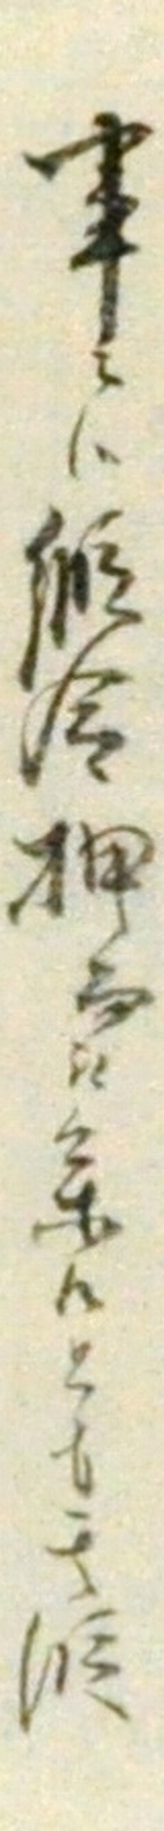事に候仮令押て被参候とも其段
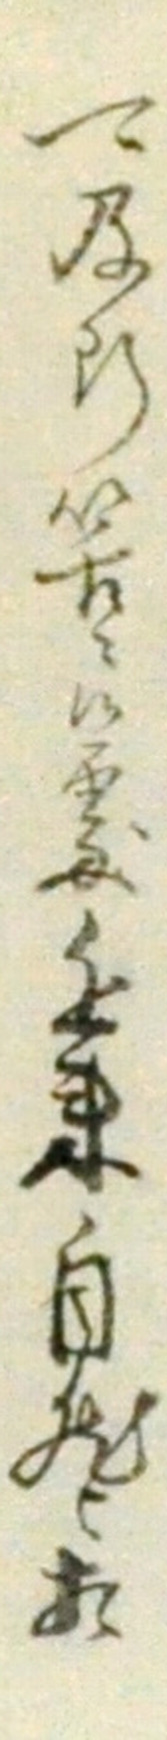可及断筈に候処近来自然被相
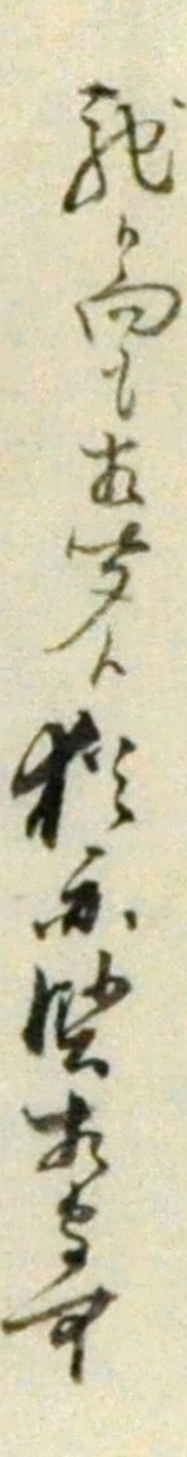弛候向も相聞候猶亦堅相守可

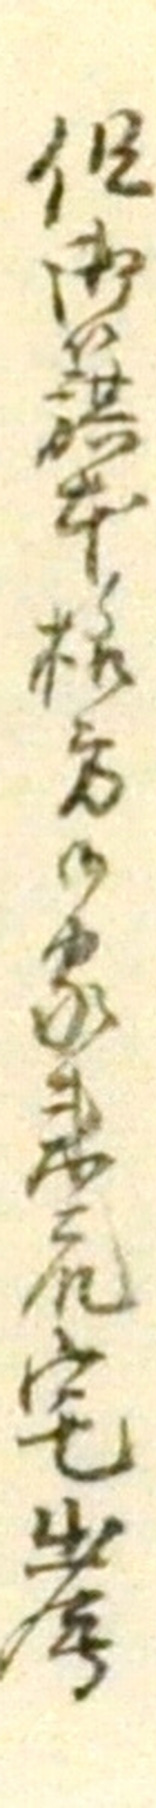但御籏本様方御家来衆宅出会
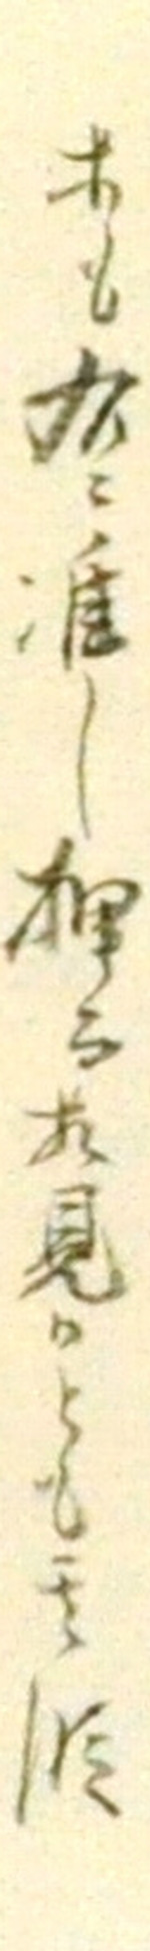等も右に准し押て相見候とも其段
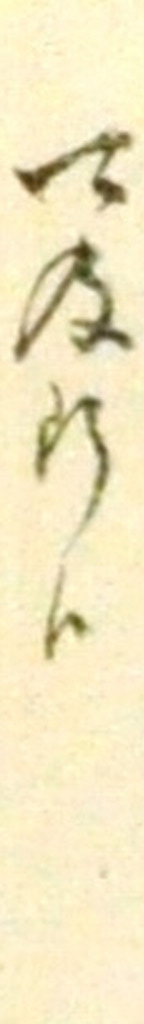可及断候
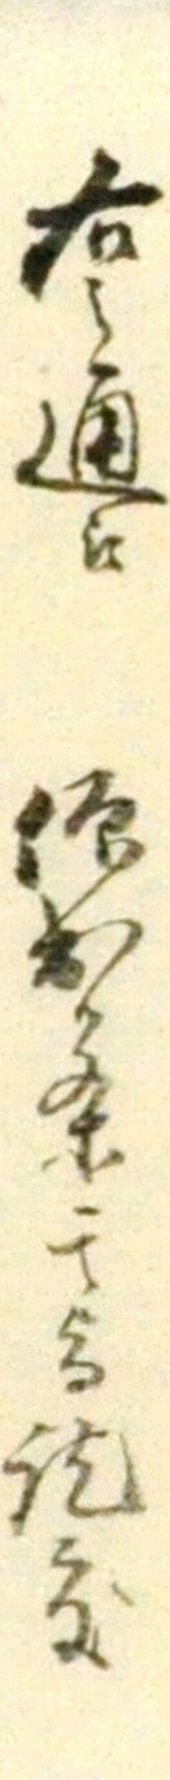右之通被仰出候条其旨訖度
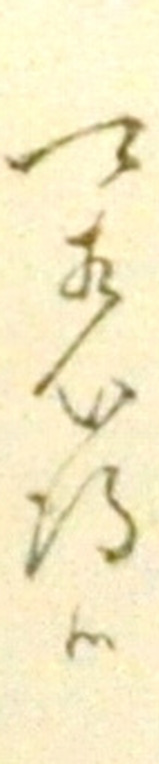可相心得候

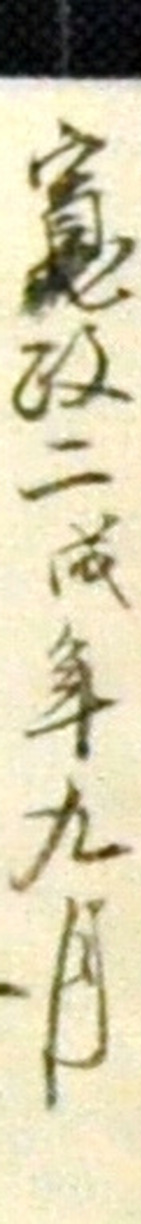寛政二戌年九月
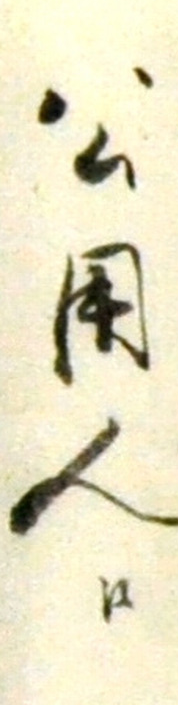公用人え
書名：公用人ヘ
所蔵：伊那市立高遠町図書館・合同会社AMANE
